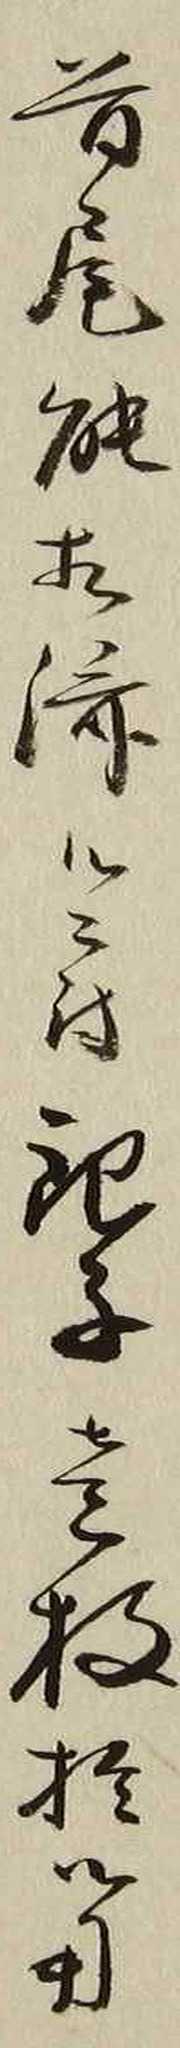首尾能相済候ニ付銀子壱枚於御用
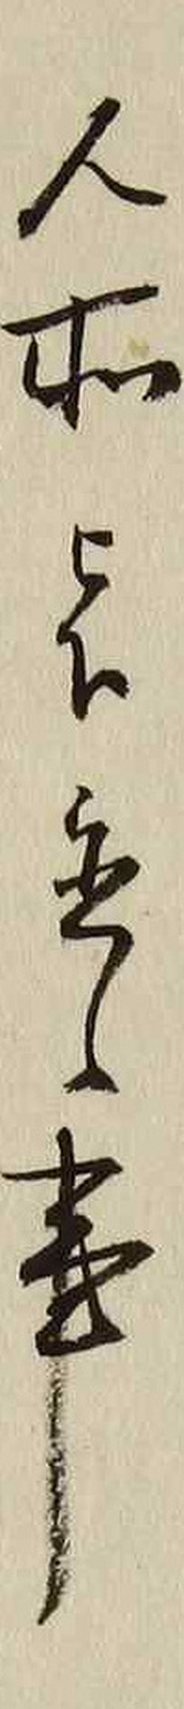人所被下置候事
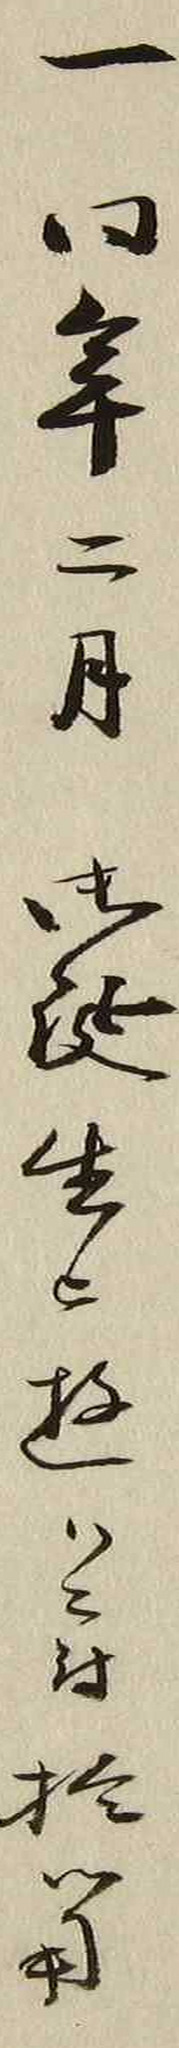一同年二月御誕生被遊候ニ付於御用
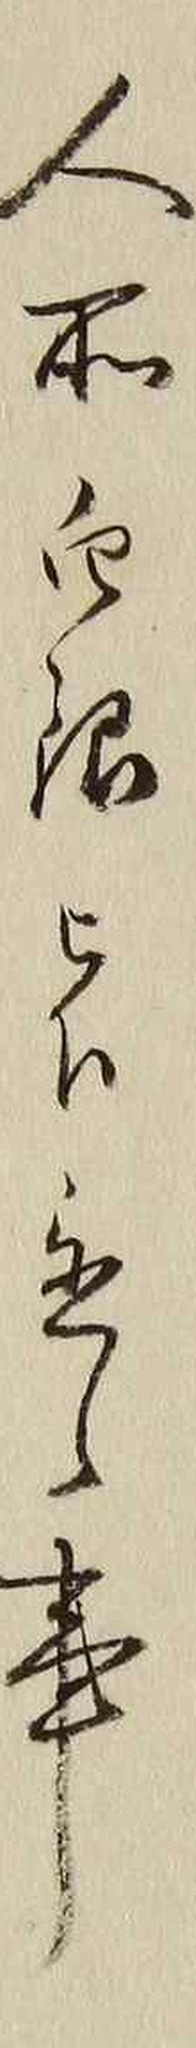人所白銀被下置候事
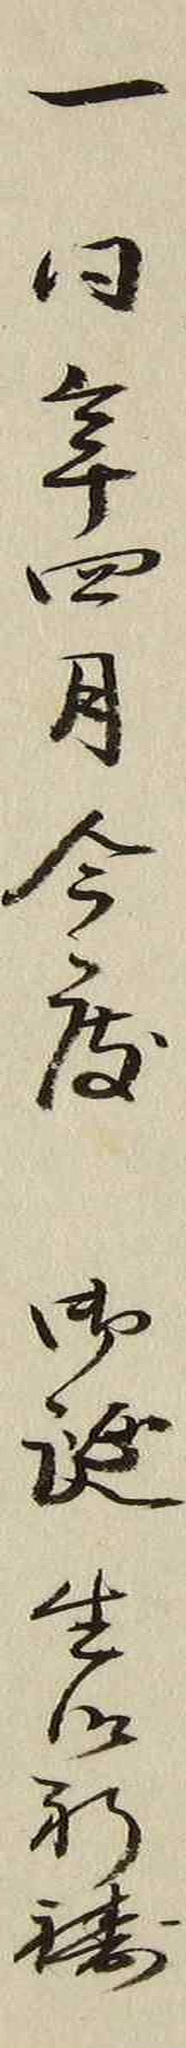一同年四月今度御誕生御祈祷
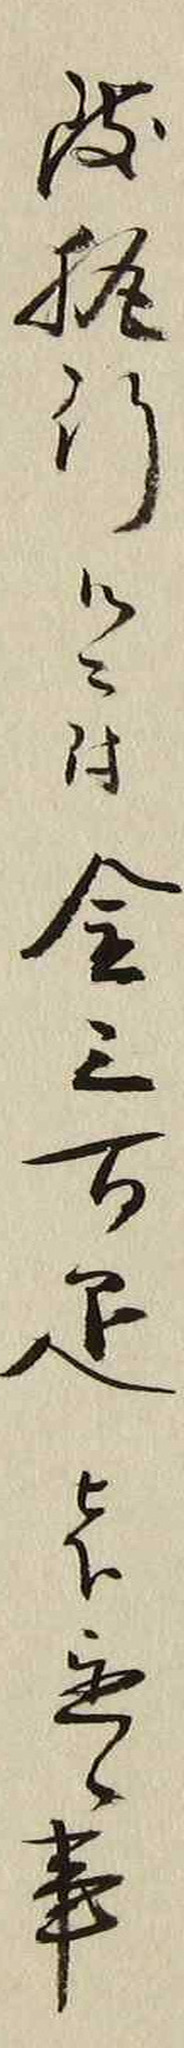致執行候ニ付金三百疋被下置候事
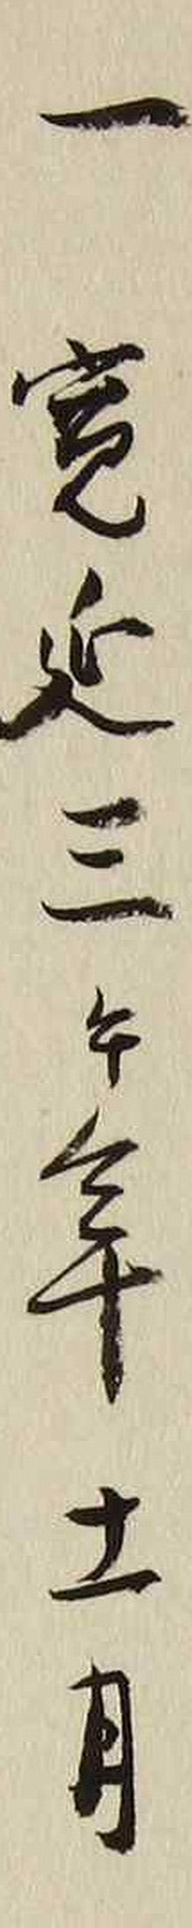一寛延三午年十一月
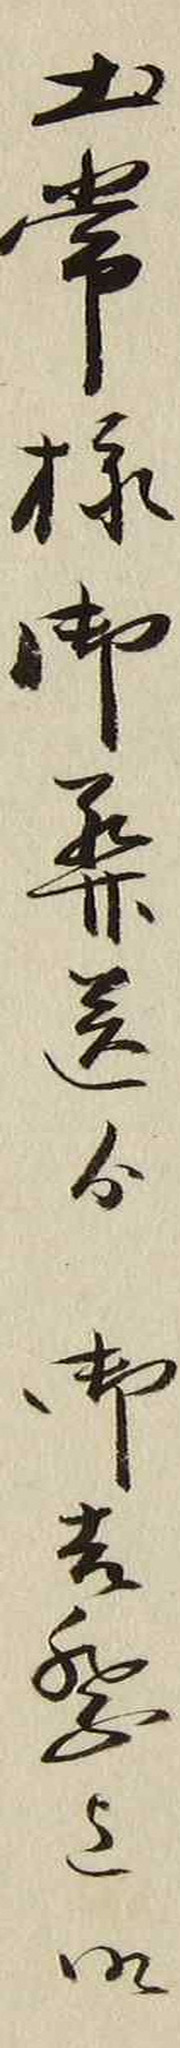土常様御葬送ゟ御吉祭迄御
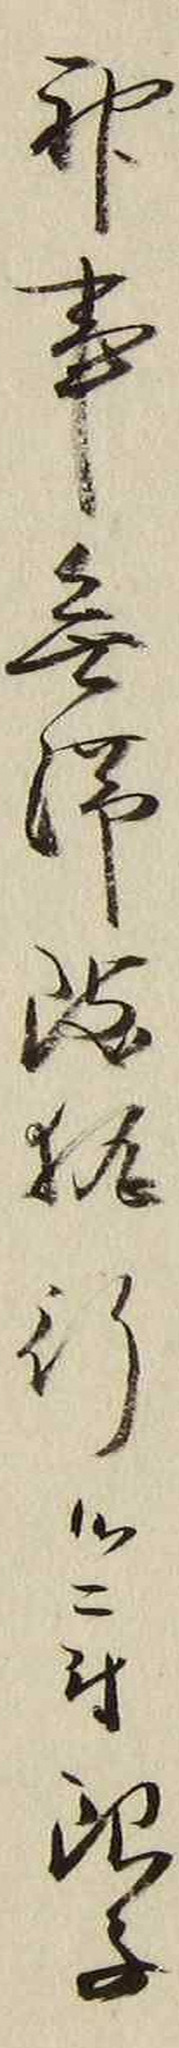神事無滞致執行候ニ付銀子
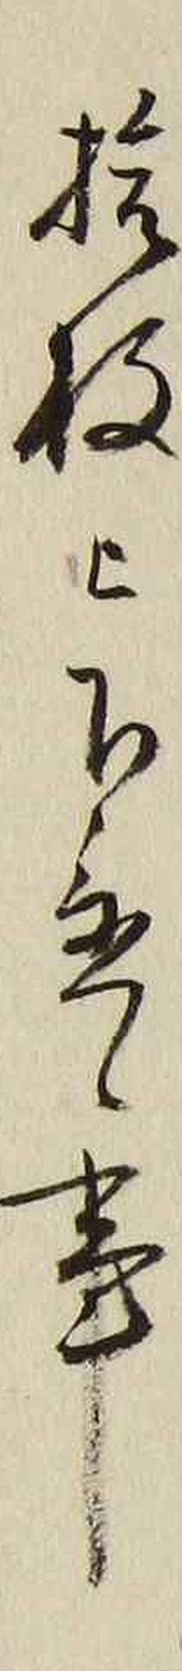拾枚被下置候事
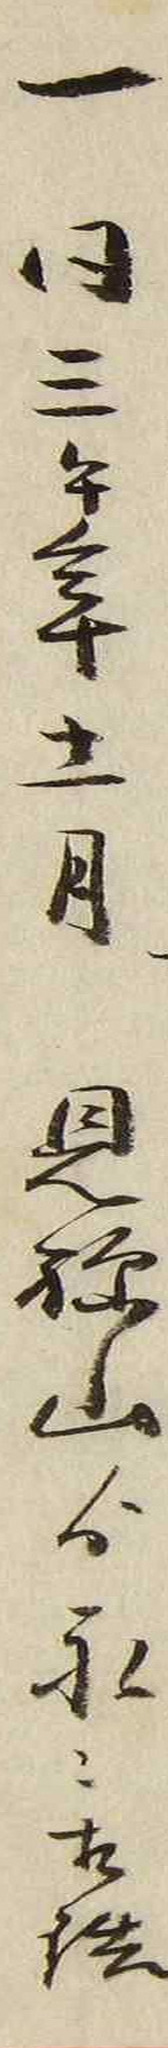一同三午年十一月見祢山ゟ永ニ相詰
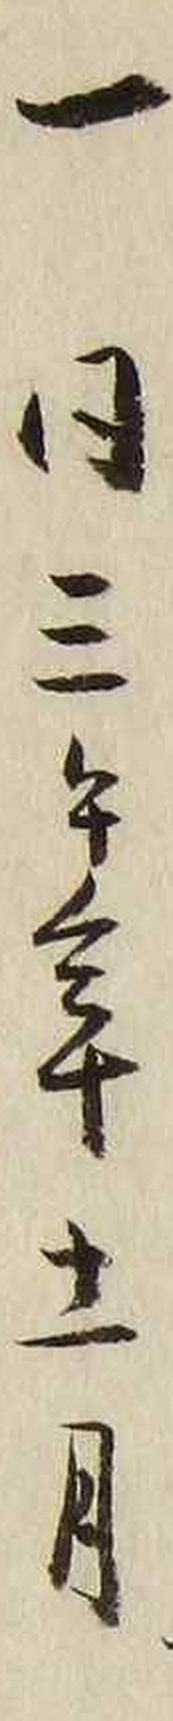一寛延三午年十一月

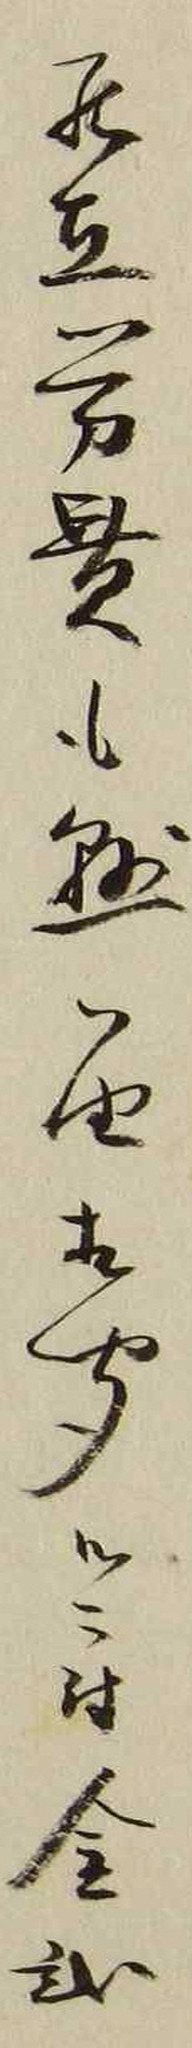罷在労費も懸候由相聞候ニ付金弐
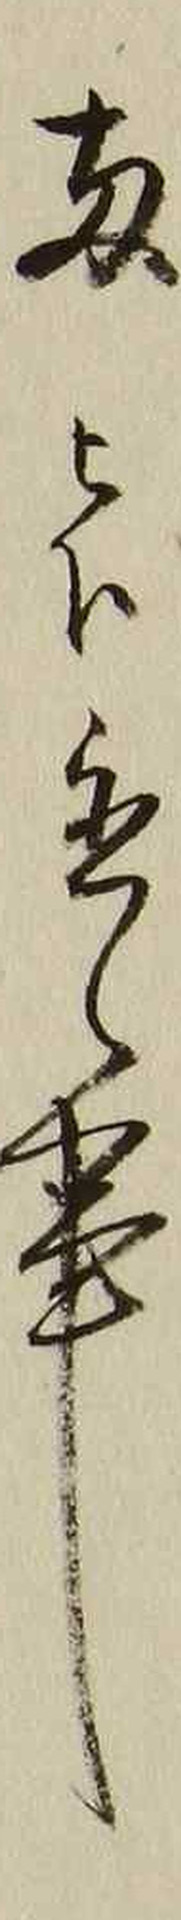両被下置候事
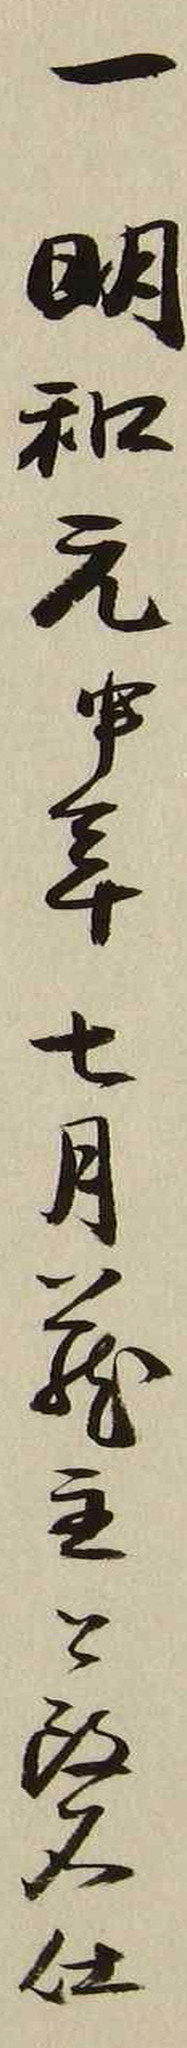一明和元申年七月蔵主と改名仕
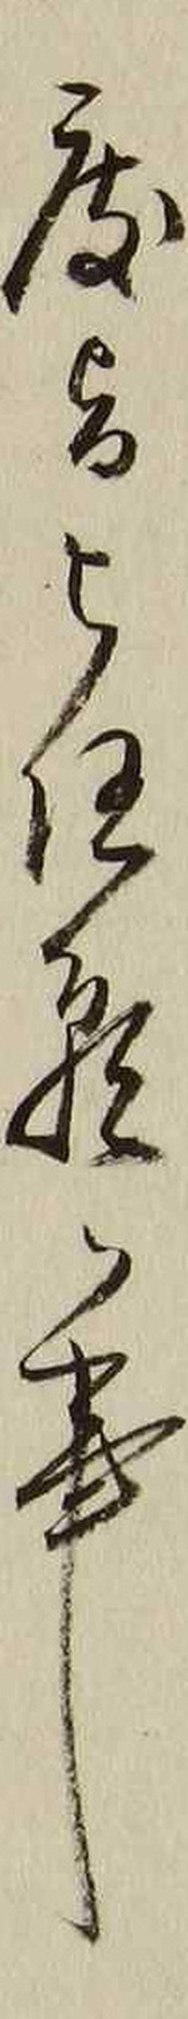度旨被任願候事
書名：諸士系譜　巻之291　さ之部23
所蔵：会津若松市立会津図書館
